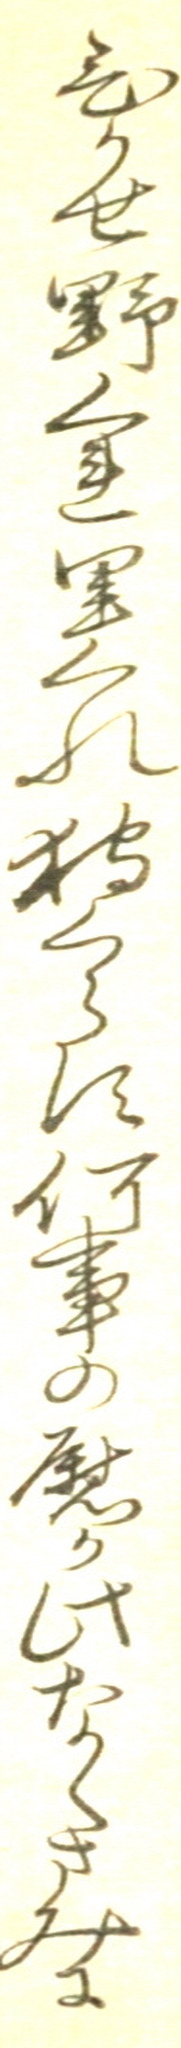ひかせ野くれ里くれ狩くらす何事の慰か此なくさみに
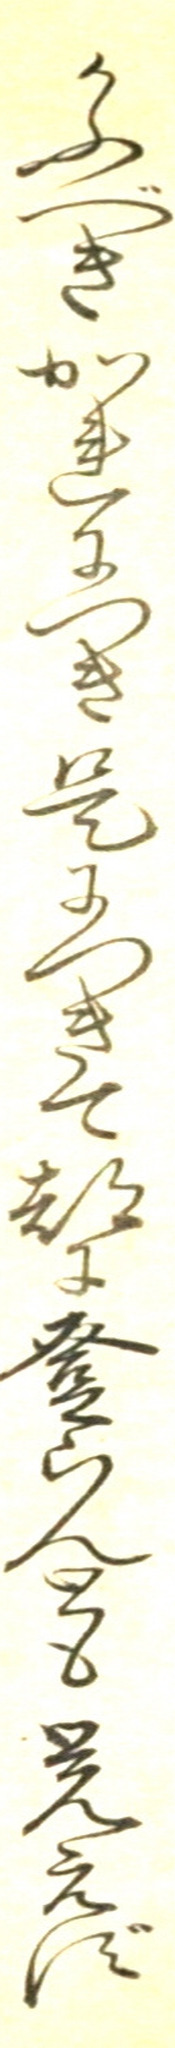かふべきかれにつき是につきて都に登らんとも覚えず
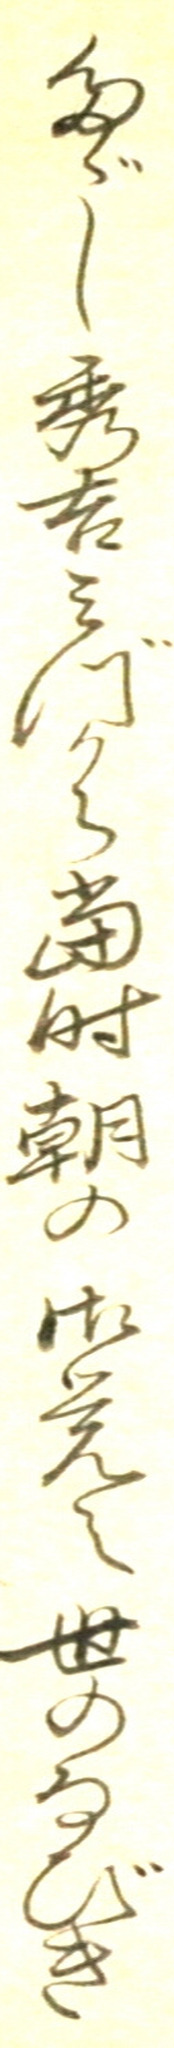たゞし秀吉みずから当時朝の御覚之世のなびき
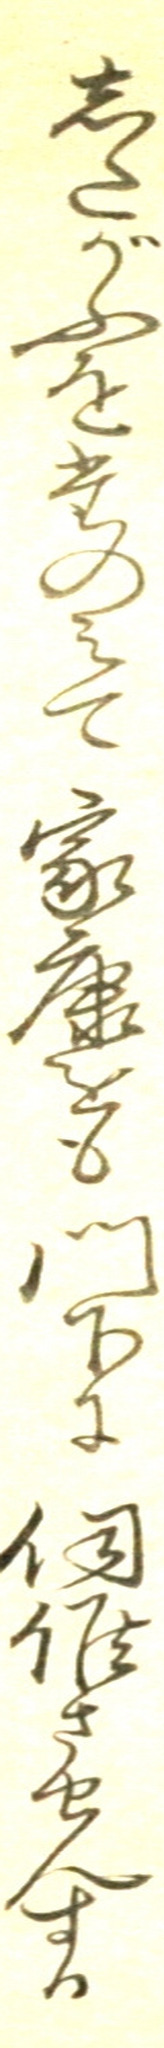したがふをたのみて家康をも門下に伺候させんする
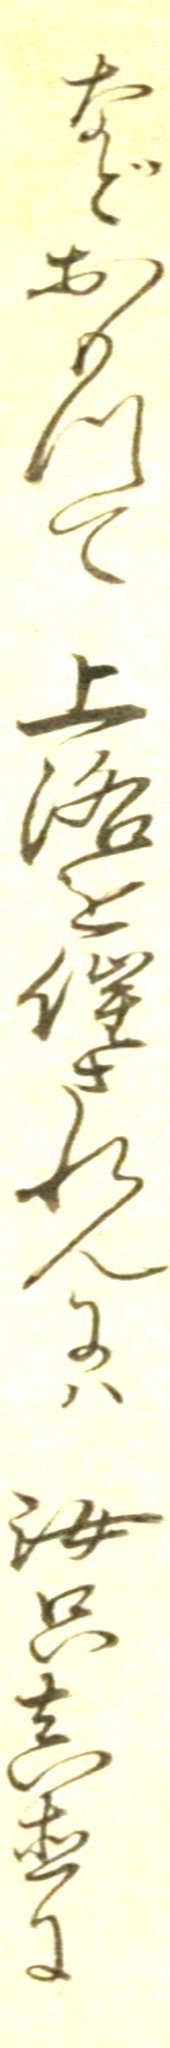などおもつて上洛を催されんには汝只真直に
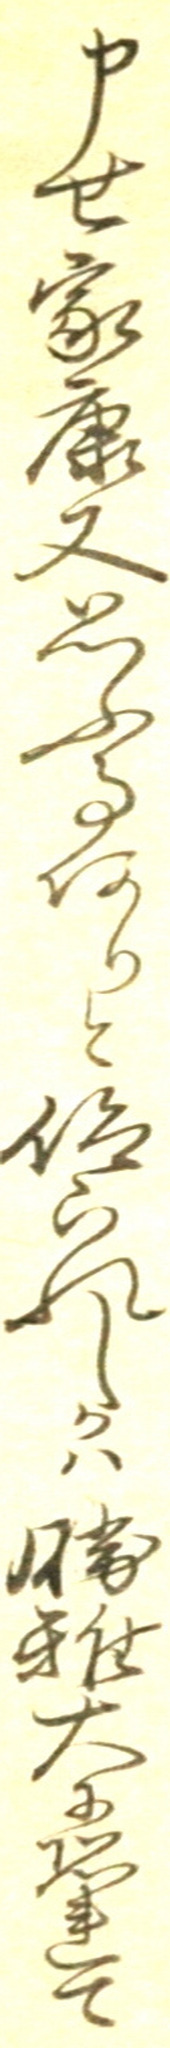申せ家康又思ふ事ありと仰られしかは勝雅大に恐れて
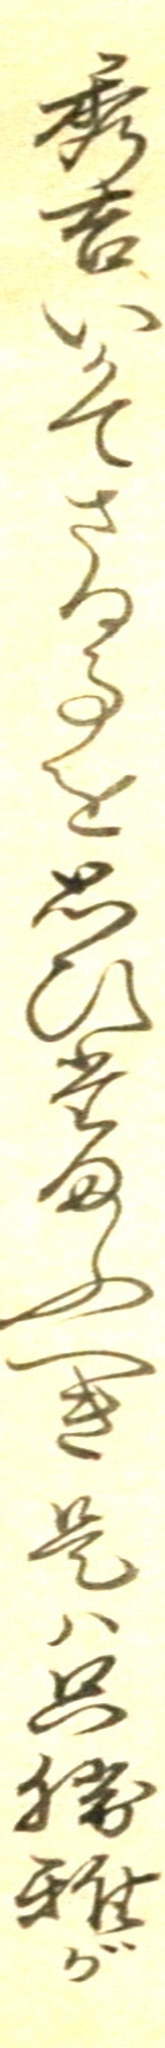秀吉いかてさる事を思ひたまふへき是は只勝雅が
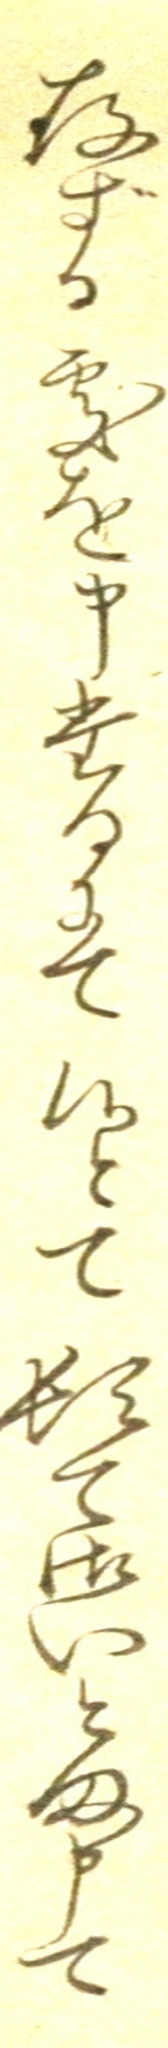存ずる処を申たるにて候とて頓て御いとま申て
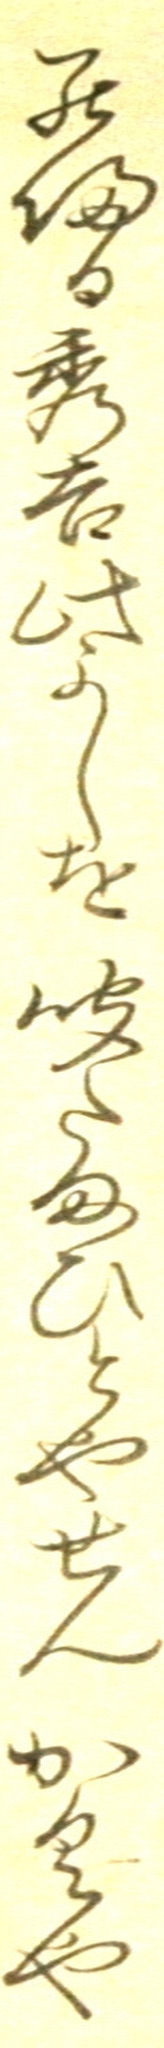罷帰る秀吉此よしを聞たまひとやせんかくや
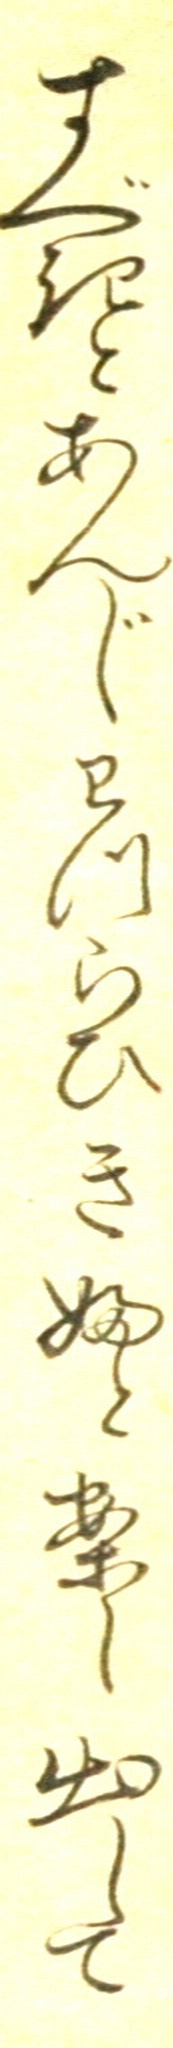すべきとあんじわつらひきふと案し出して

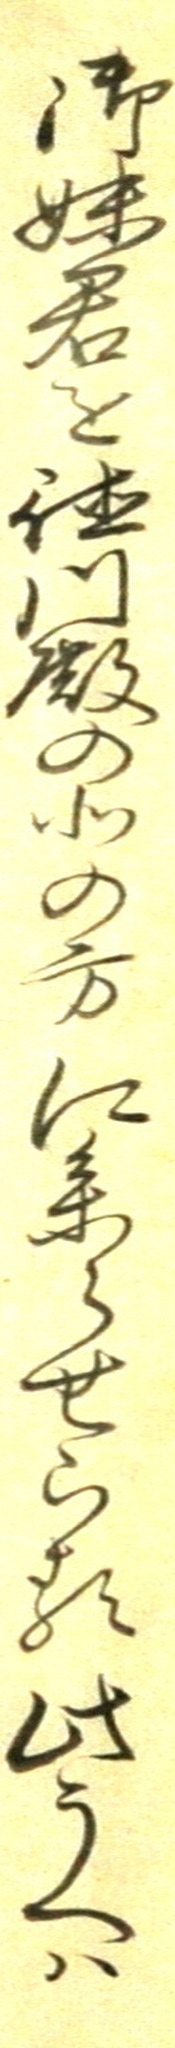御妹君と徳川殿の北の方に参らせらる此うへは
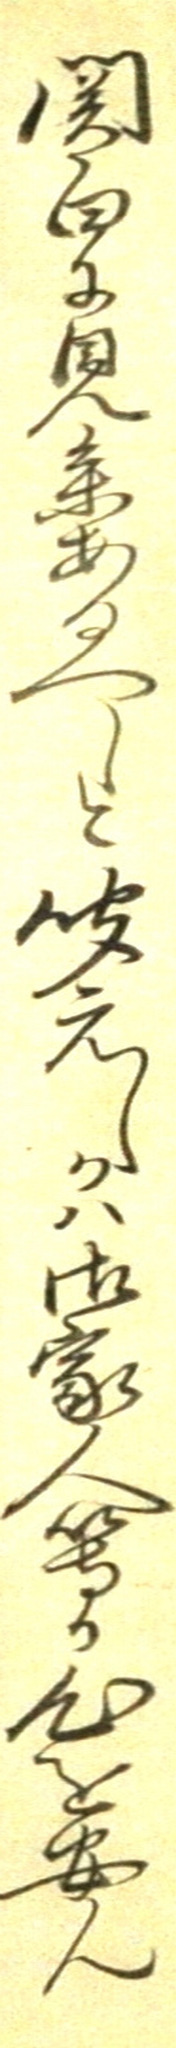関白に見参あるへしと聞えしかは御家人等か心を安ん
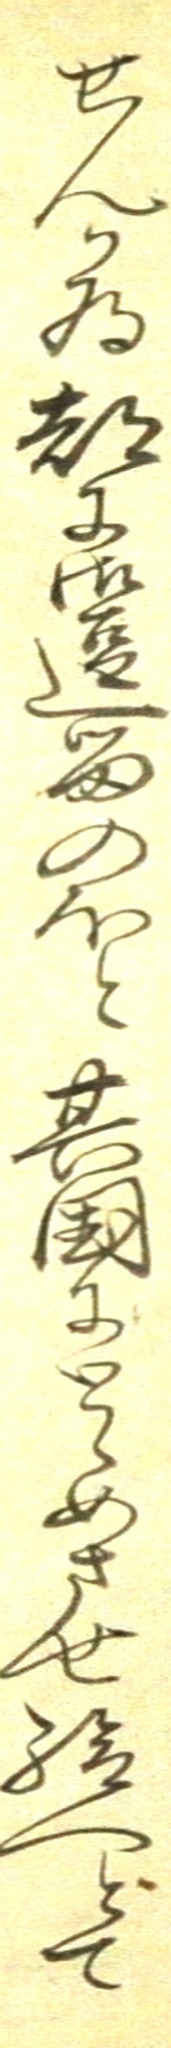せんか為都に御逗留のほと其国にとゝめさせ給へとて
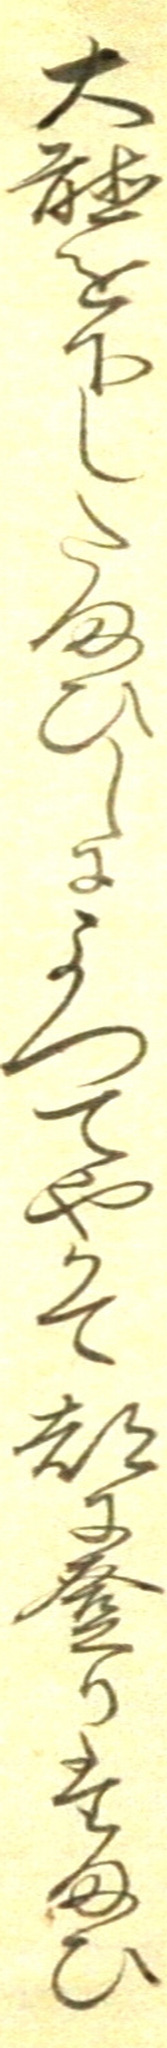大聴を下したまひしによつてやかて都に登りたまひ
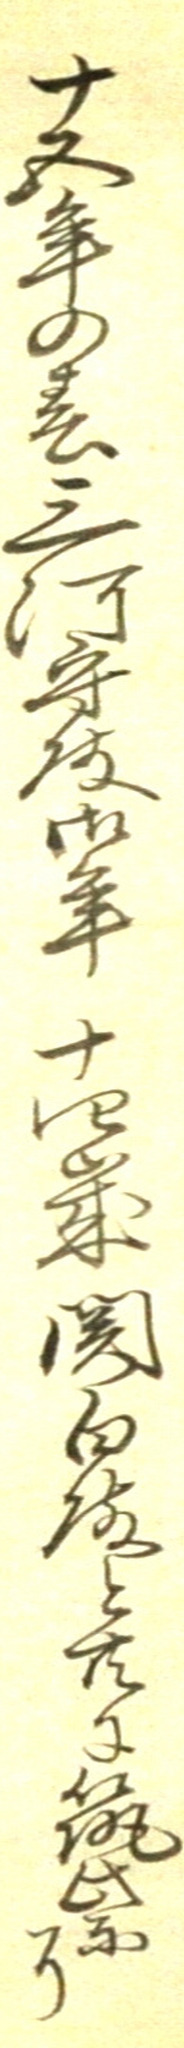十五年の春三河守殿御年十四歳関白殿と共に筑紫に
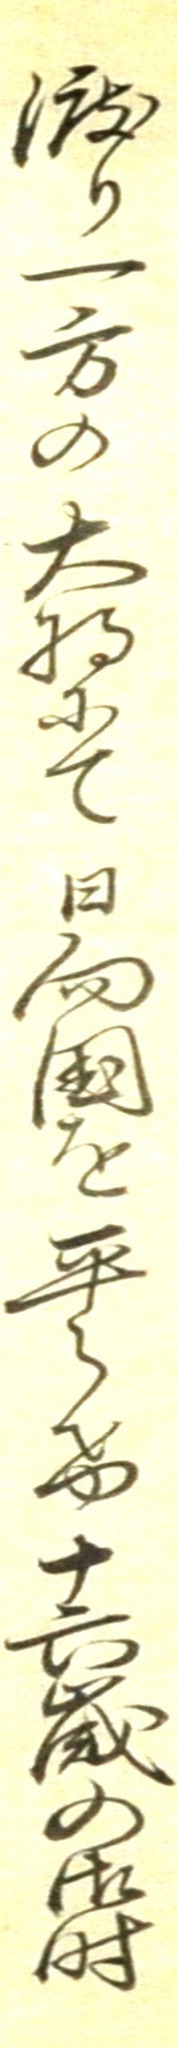渡り一方の大将にて日向国を平らけ十六歳の御時
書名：藩翰譜（一）
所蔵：伊那市立高遠町図書館・合同会社AMANE
